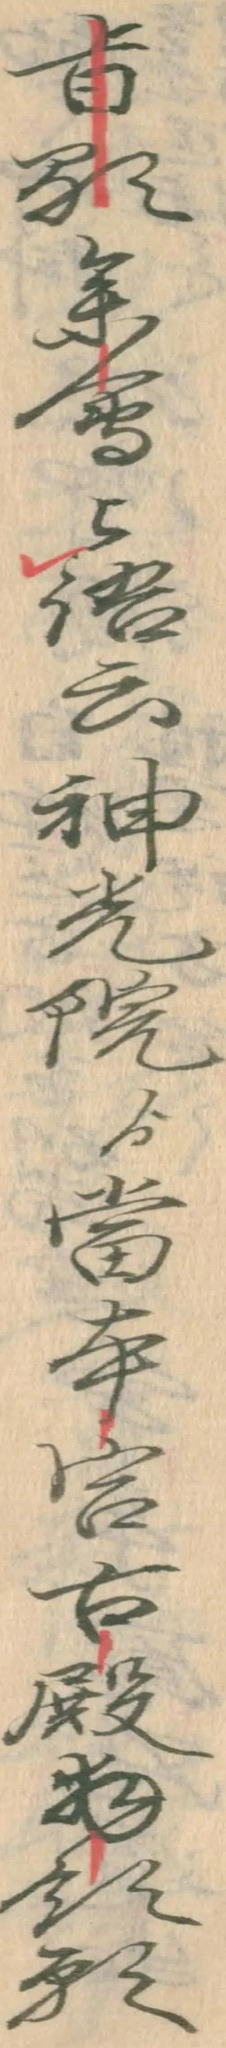旨顕参-会被語云神光院ゟ当本-宮古-殿拝-領願
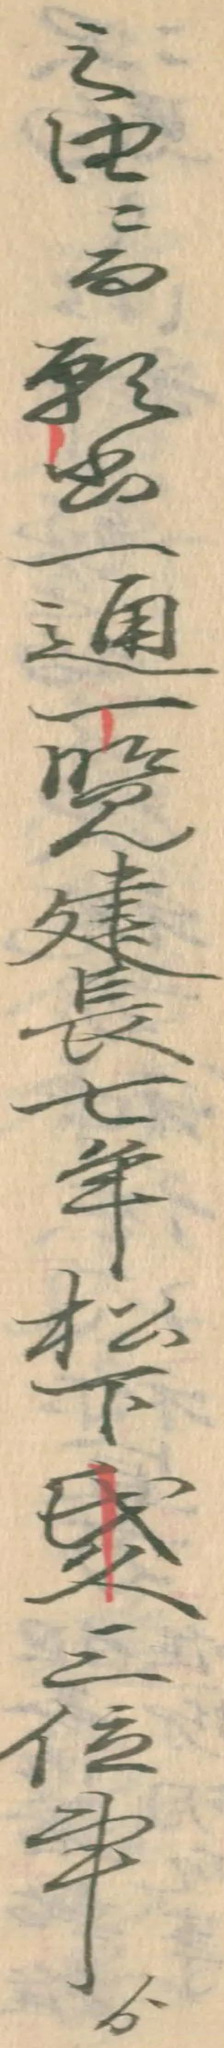之由ニ而願_書一通一-覧建長七年松下氏久三位事ゟ
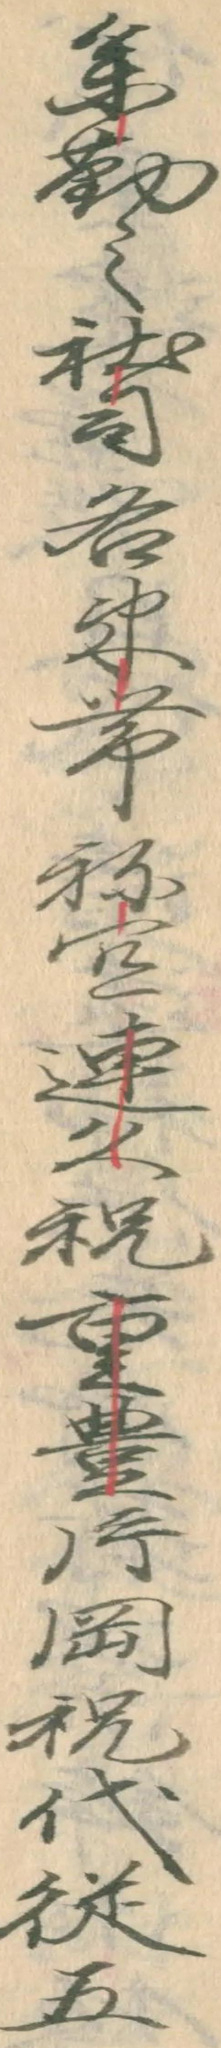参-勤之社-司各束-帯祢-宜連久税重豊片岡祝代従五
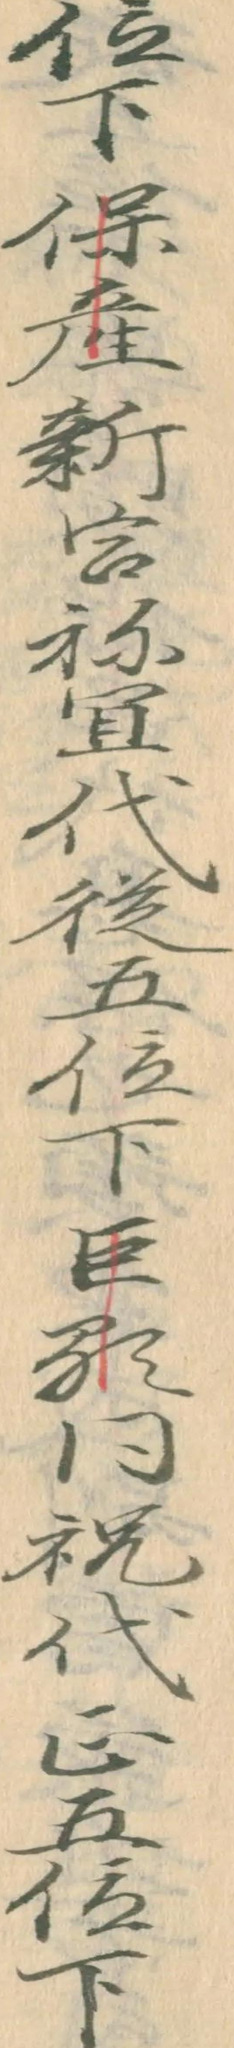位下保産新宮祢宜代従五位下巨顕同祝代正五位下
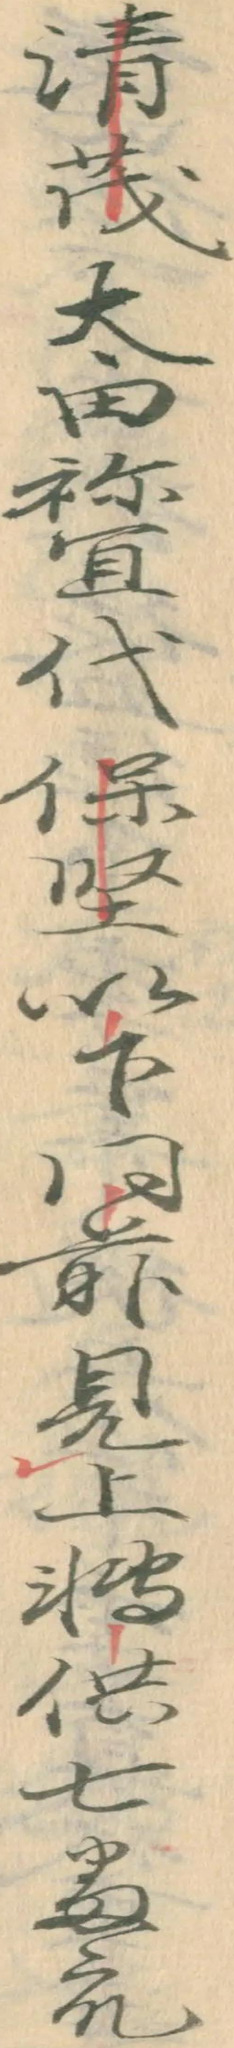清茂太田祢宜代保堅以-下同-前見上転-供七番衆

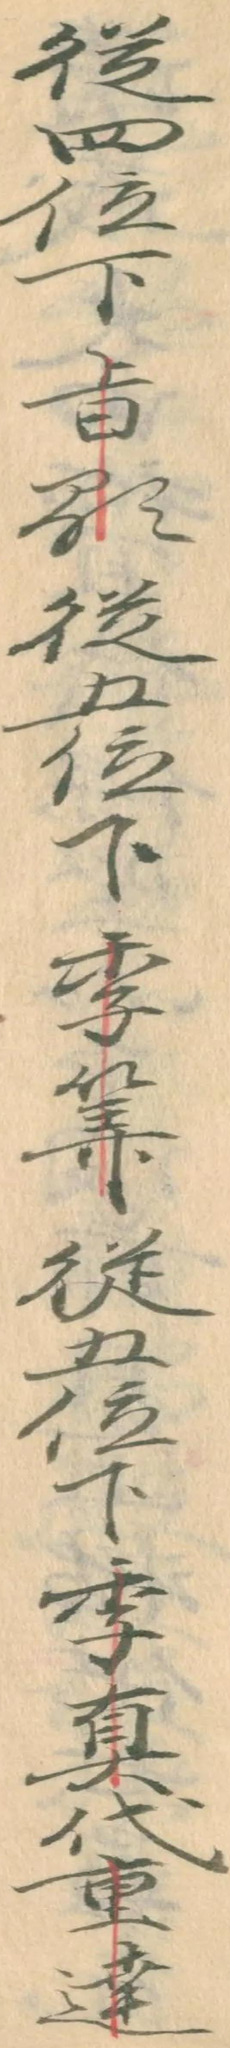従四位下旨顕従五位下李算従五位下季真代重達
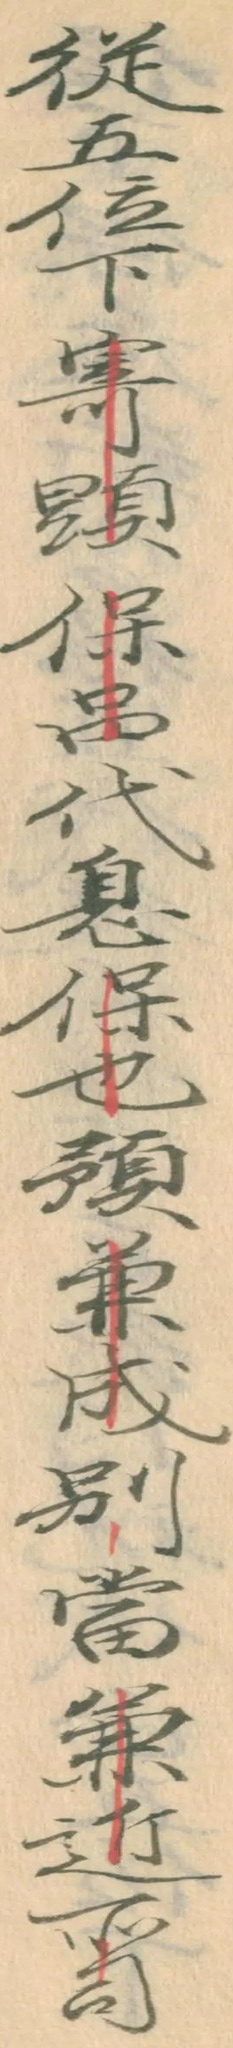従五位下寄顕保品代息保也預兼成別-当兼近所-司
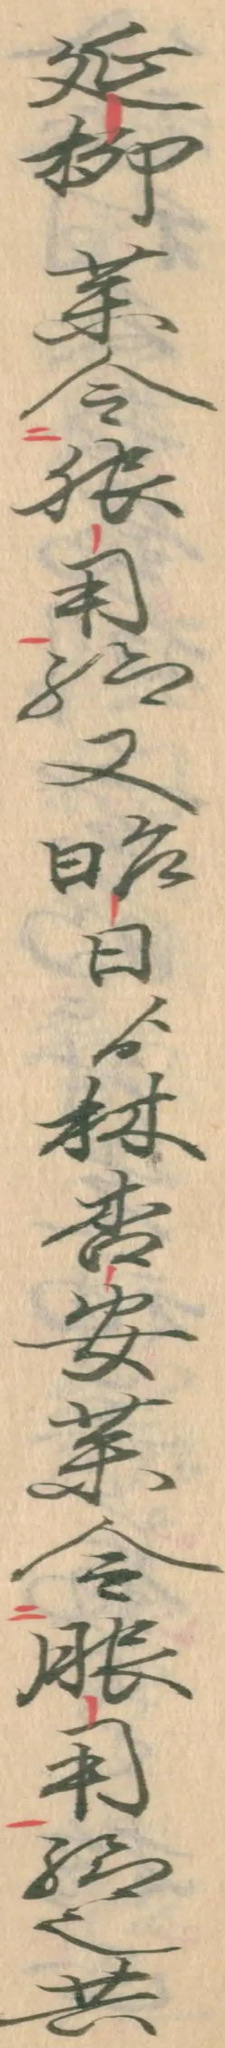延-柳薬令服-用給又昨-日ゟ林杏-安薬令服-用給也共
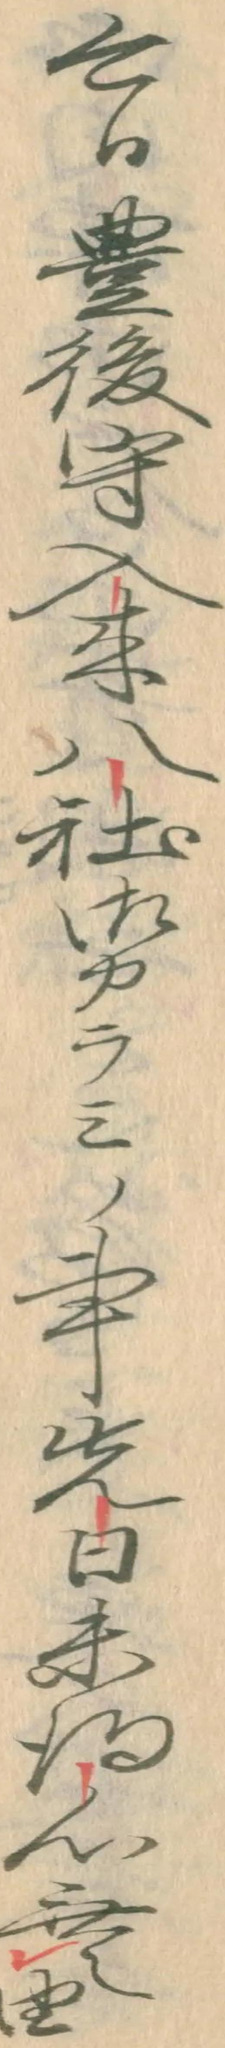今日豊後守入-来八-社御カラミノ事先-日未得-心無之由

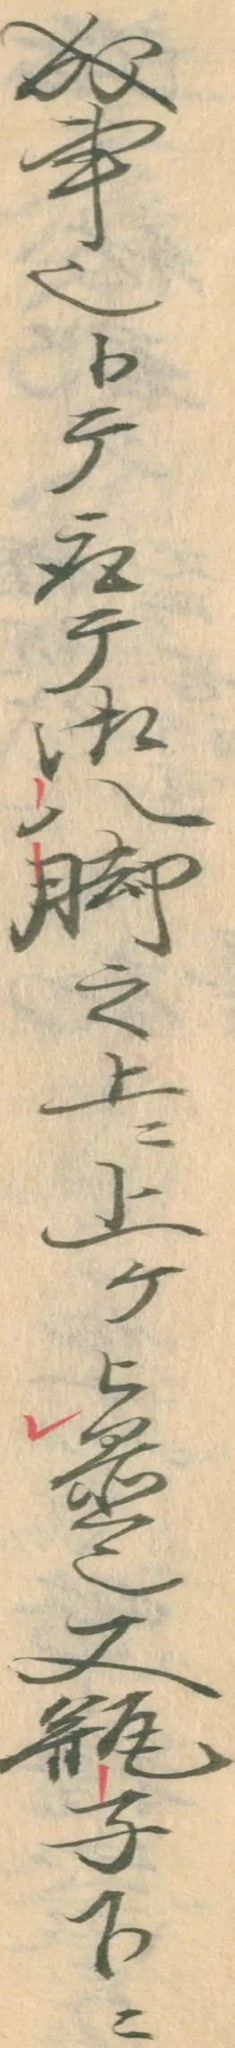成事也トテ取テ御_脚之上ニ上ケ被置也又瓶-子下ニ
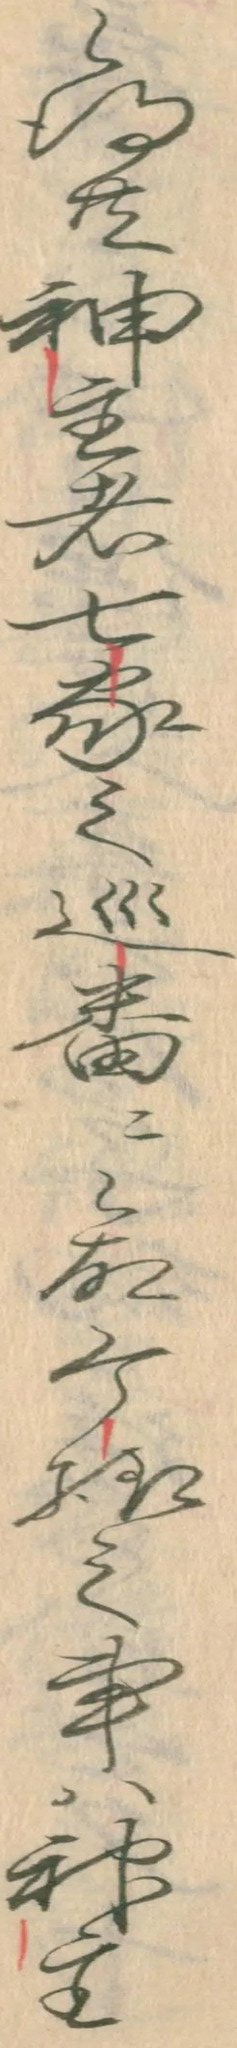候得共神_主者七-家之巡-番ニ候故ケ-様之事ハ神_主
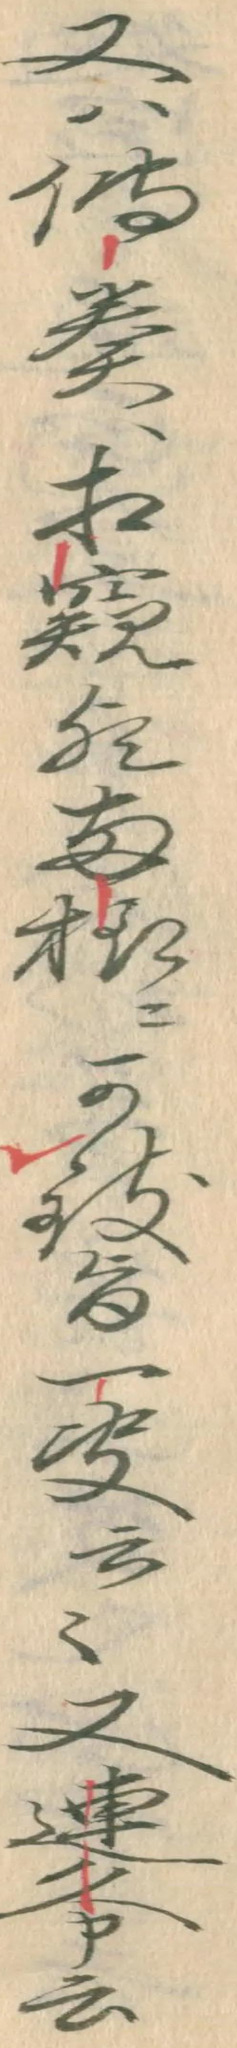又ハ伝-奏ヘ相-窺歟両-様ニ可致旨一-決云々又連久申云
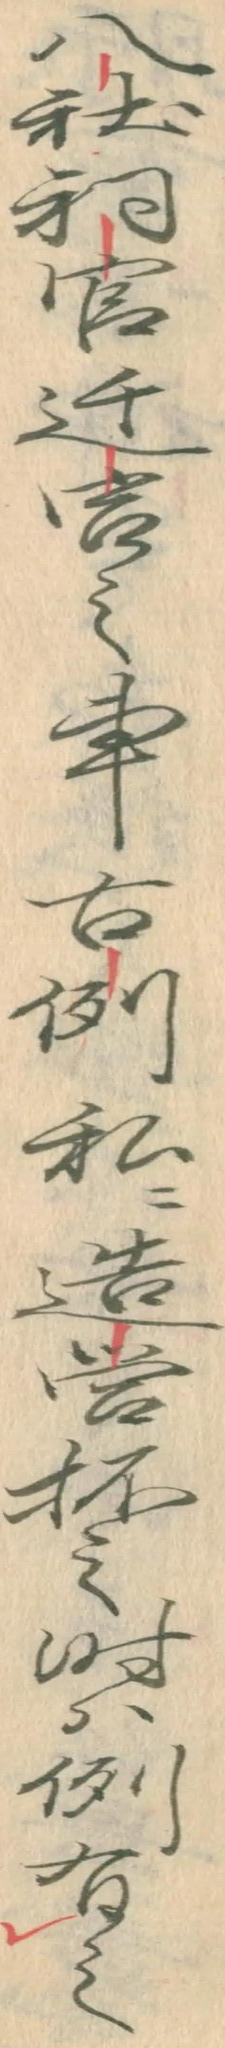八-社祠-官迁-宮之事古-例私ニ造-営抔之時ハ例有之
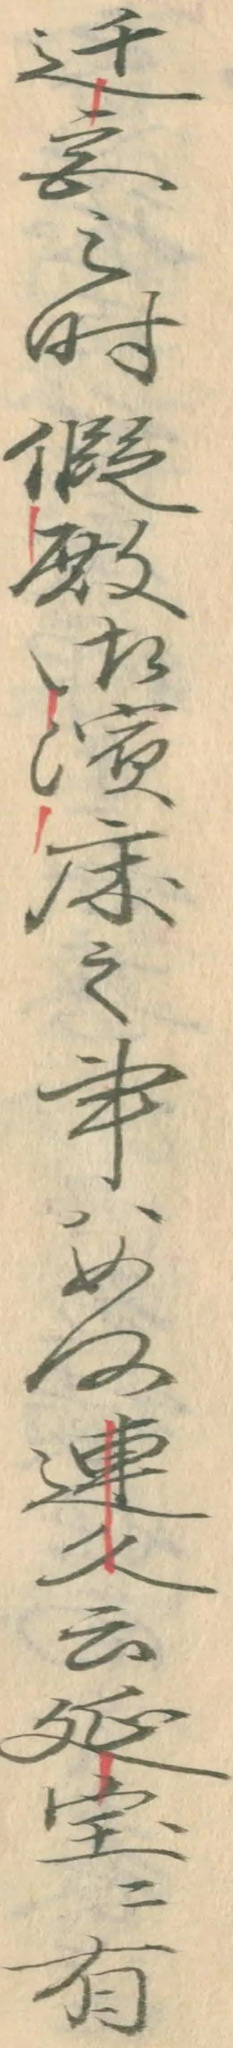迁-宮之時仮_殿御_浜_床之事ハ如何連久云延-宝ニ有

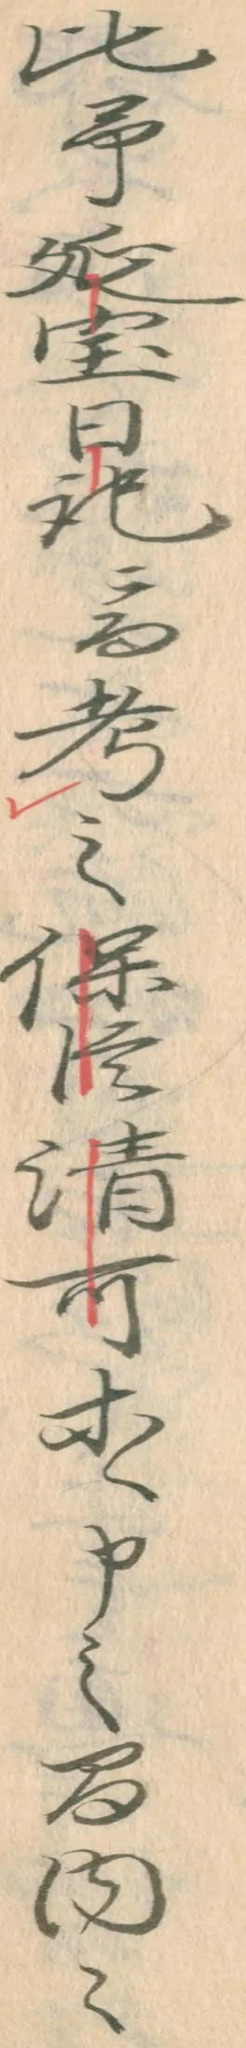比予延-宝日-記ニ而考之保臣清可等へ申之間内々
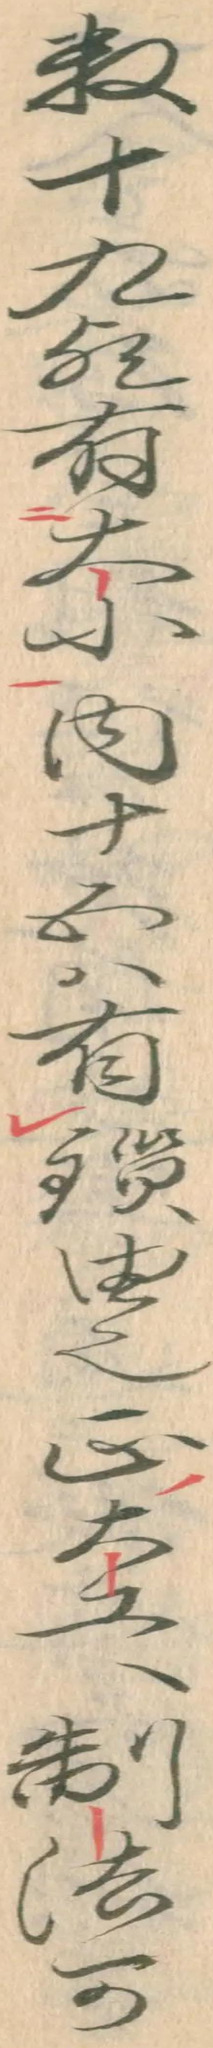数十九歟有大-小内十五ハ有鎖由也正大-工へ制-法可
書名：賀茂社記録. 第16冊
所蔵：国立国会図書館 National Diet Library, JAPAN
